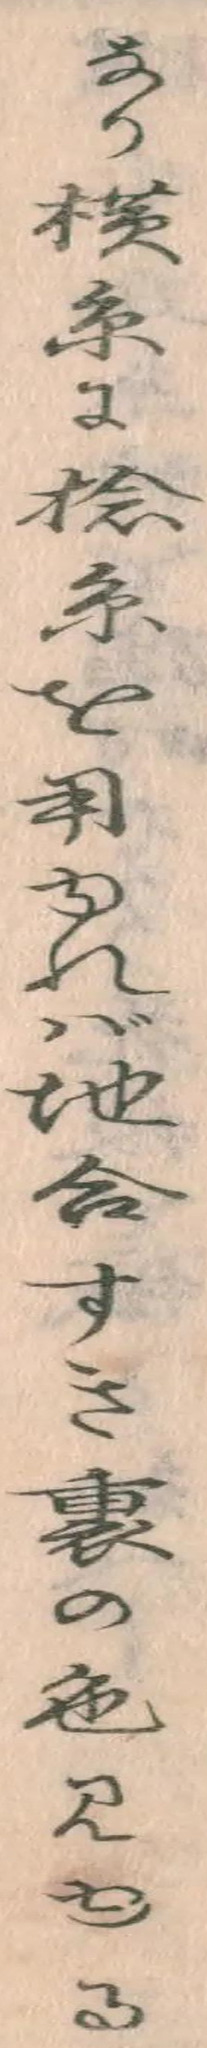なり横糸に捻糸を用ゆれば地合すき裏の色見ゆる
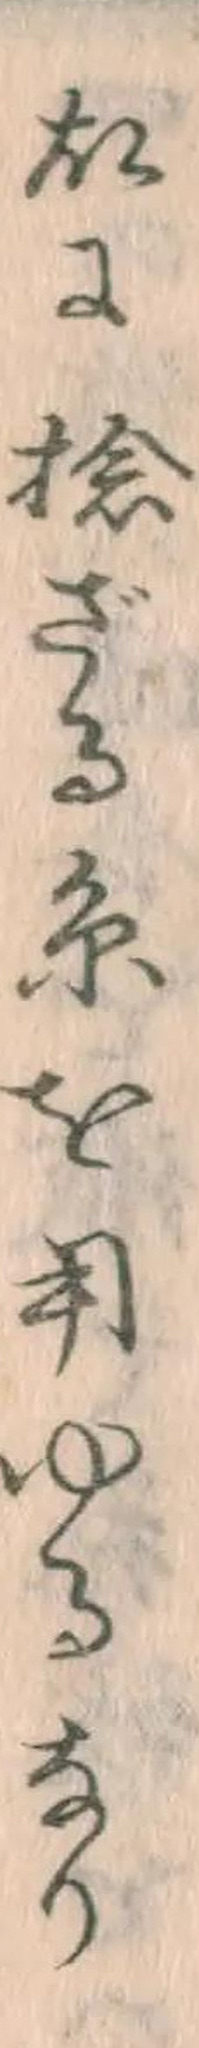故に捻ざる糸を用ゆるなり
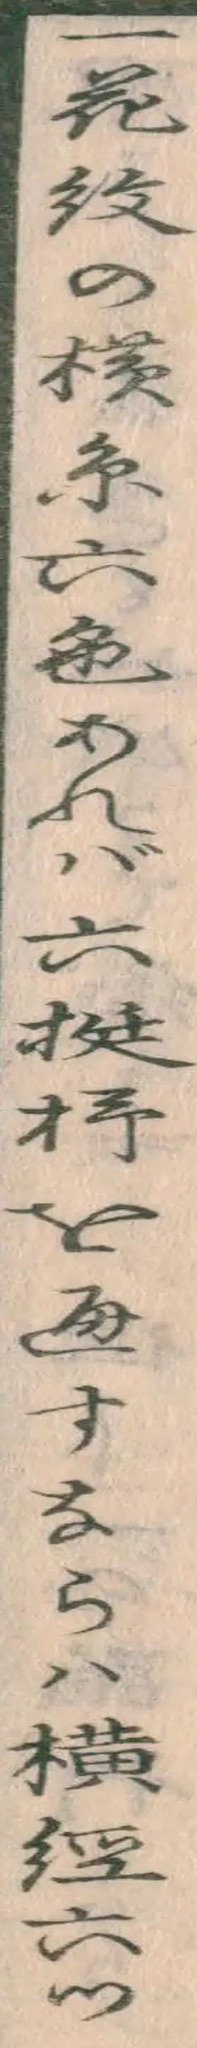一花紋の横糸六色あれば六挺杼を通すならは横経六ッ
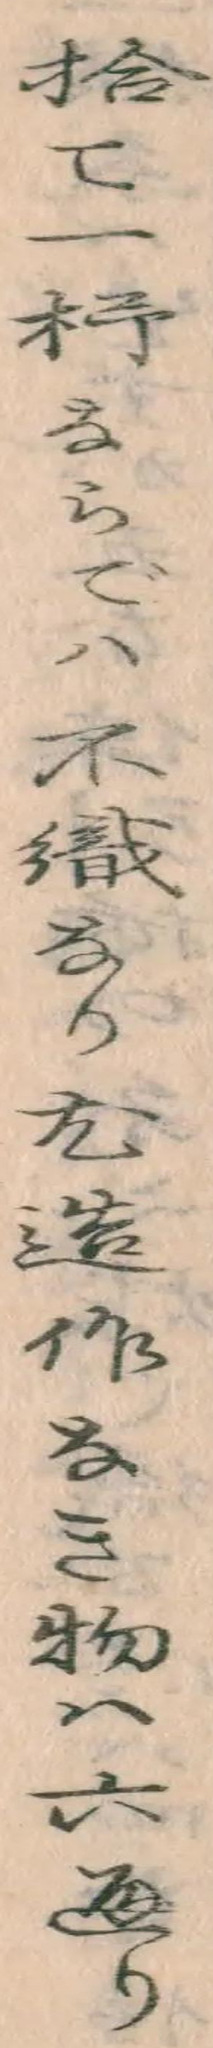拾て一杼ならでは不織なり尤造作なき物は六通り
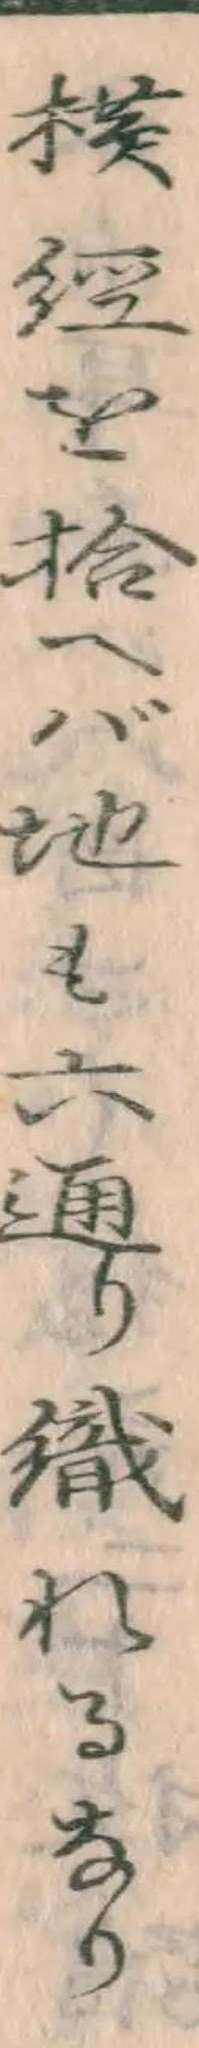横経を拾へば地も六通り織れるなり
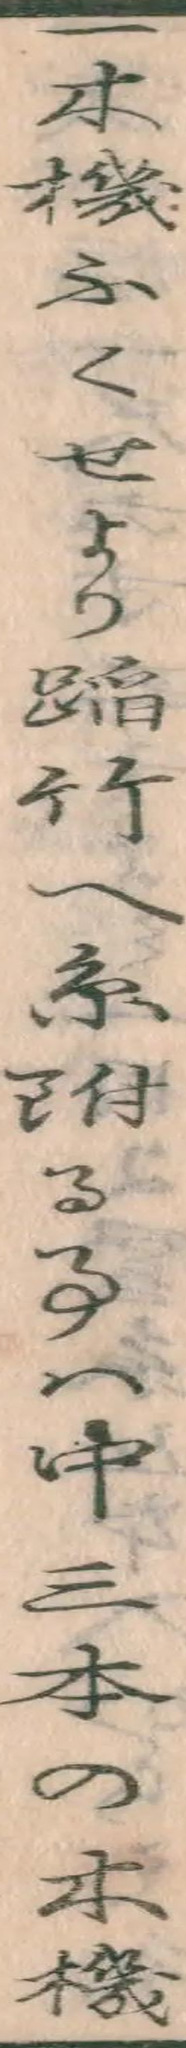一木機ふくせより蹈竹へ糸附る事は中三本の木機
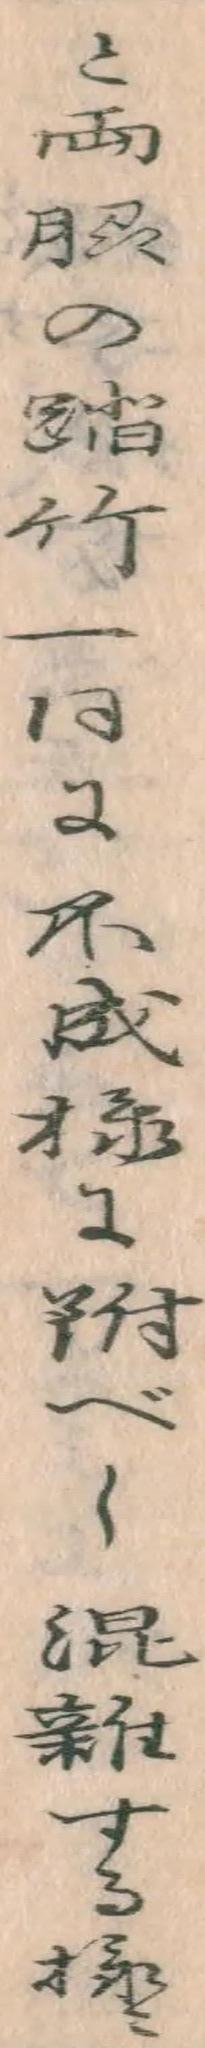と両脇の蹈竹一同に不成様に附べし混雑する様に
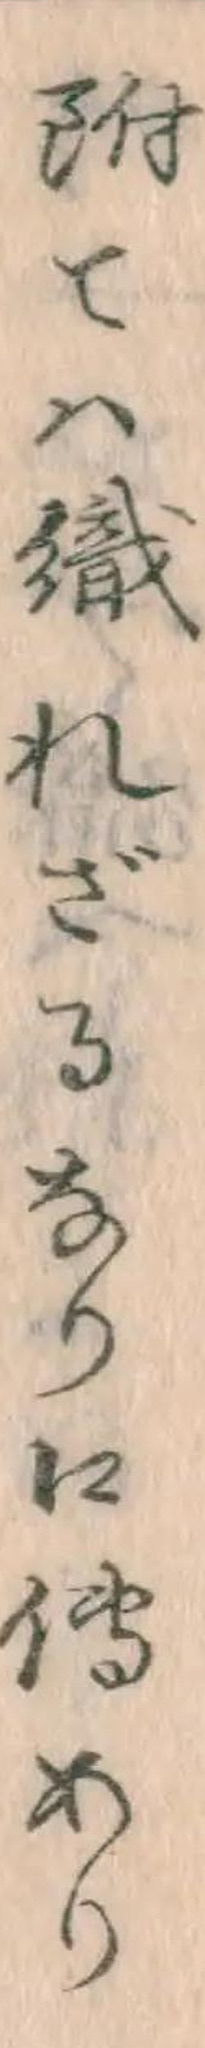附ては織れざるなり口伝あり
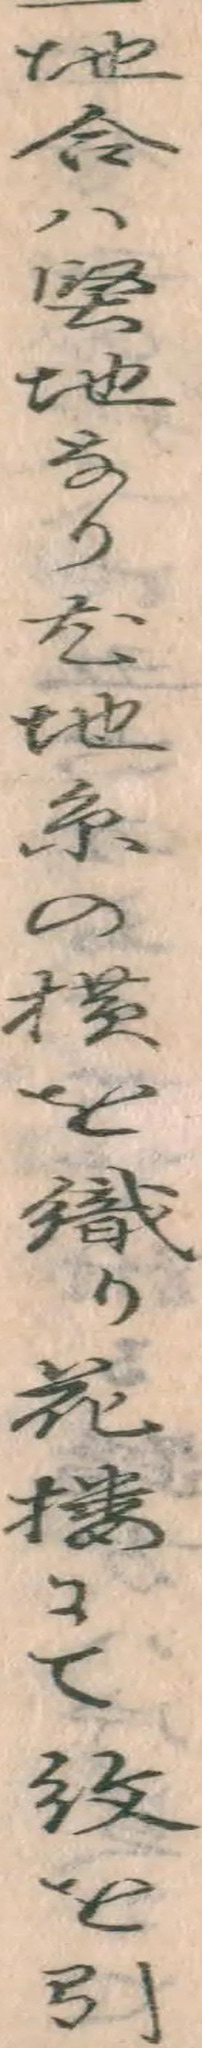一地合は堅地なり尤地糸の横を織り花楼にて紋を引
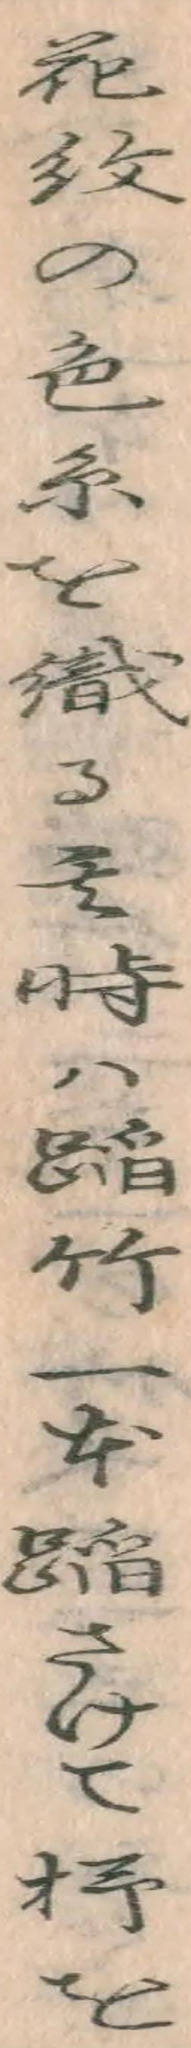花紋の色糸を織る其時は蹈竹一本蹈さけて杼を
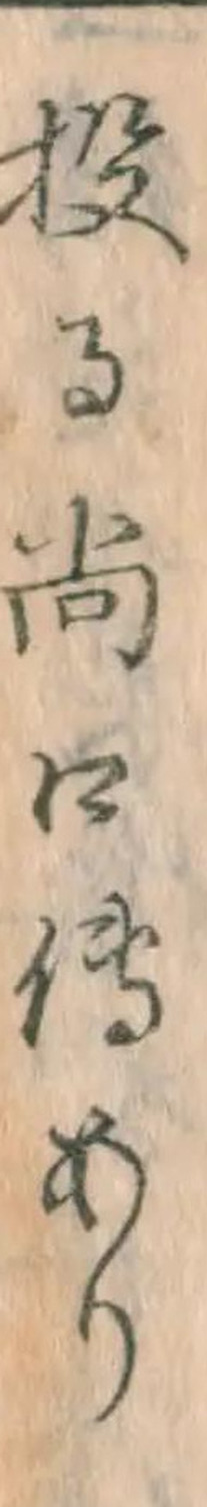投る尚口伝あり
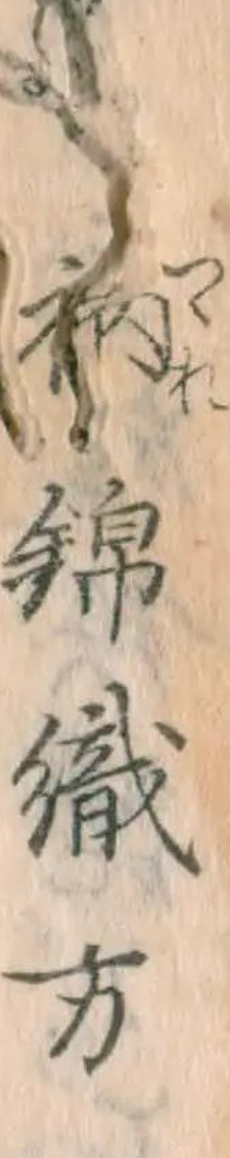倭錦織方
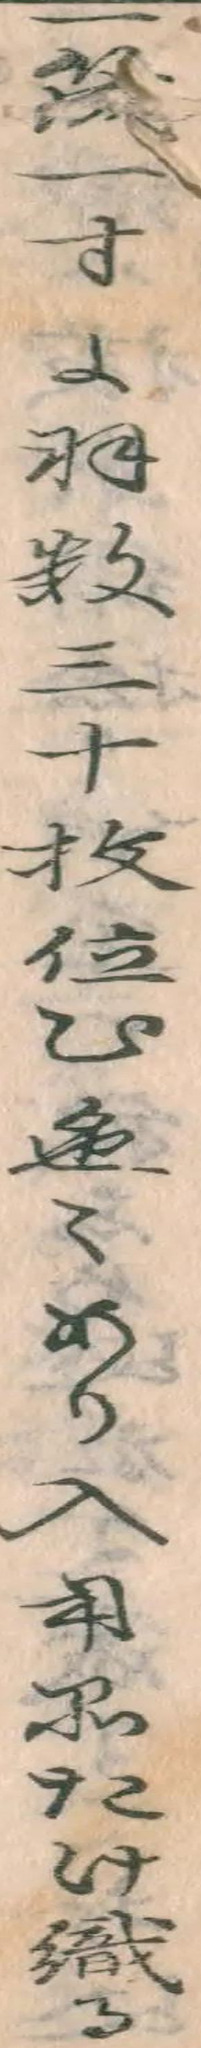一筬一寸に羽数三十枚位ひ色々あり入用品たけ織る
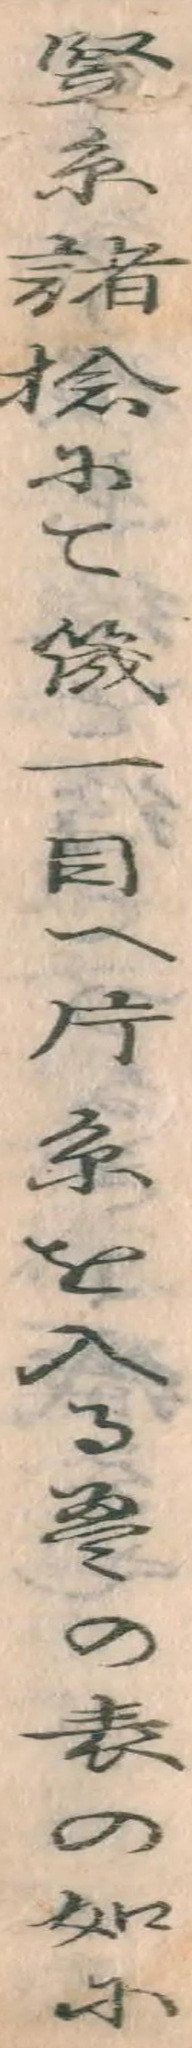竪糸諸捻にて筬一目へ片糸を入る畳の表の如に
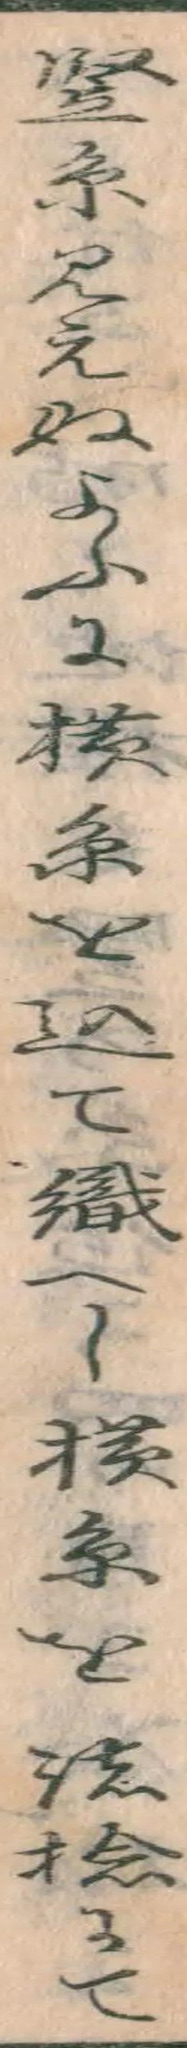竪糸見えぬよふに横糸を込て織へし横糸を諸捻にて
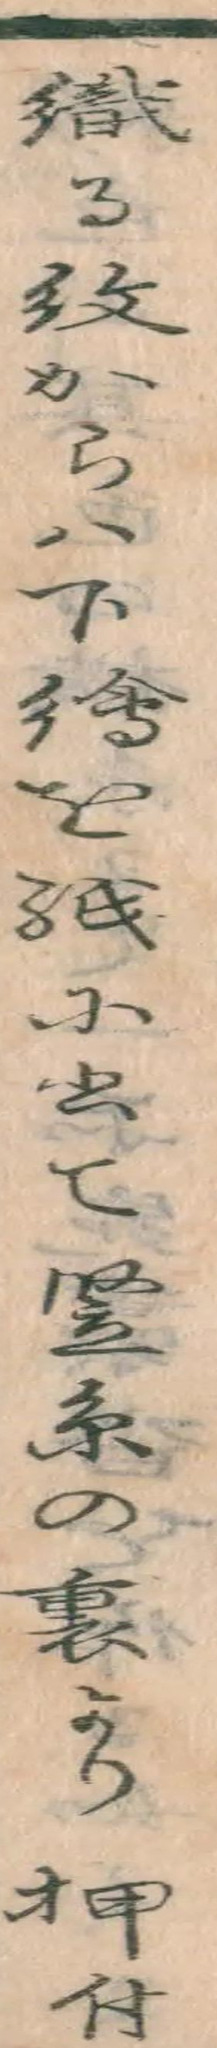織る紋からは下絵を紙に書て竪糸の裏より押付
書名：機織彙編 5巻. [2]
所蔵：国立国会図書館 National Diet Library, JAPAN
